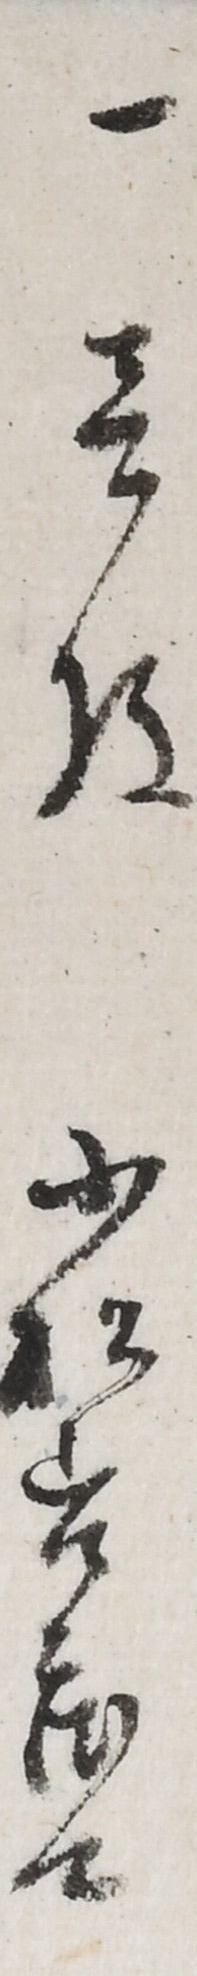一壱枚小松善蔵
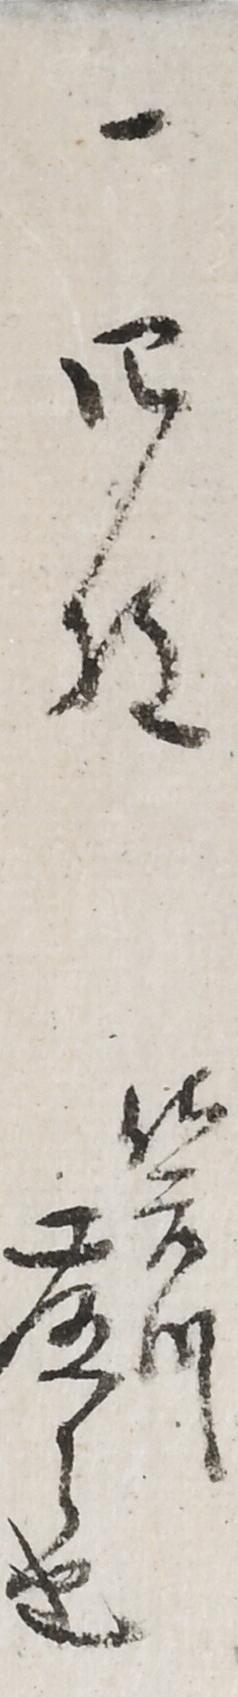一四枚藤之助
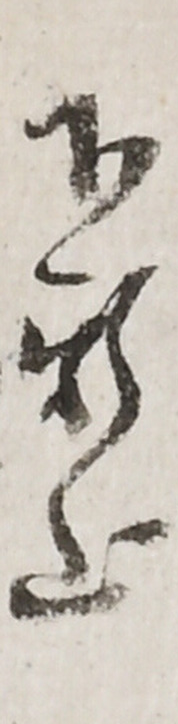下新山
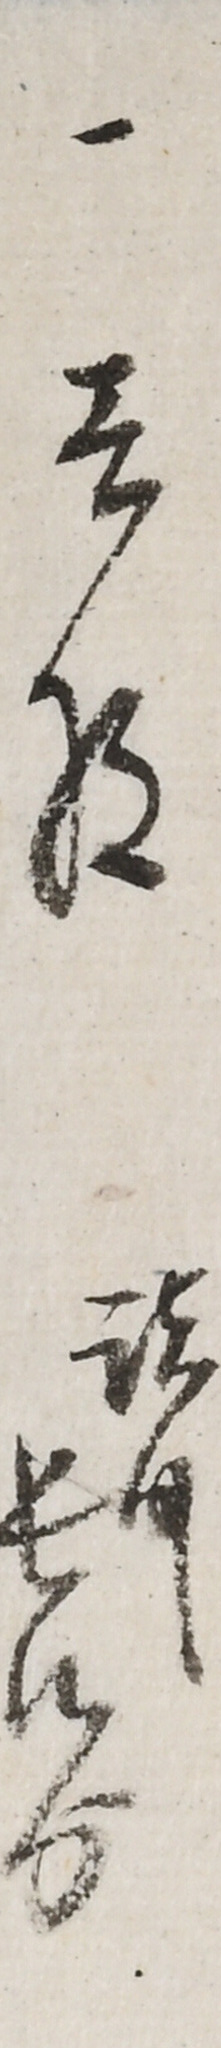一壱枚良吉
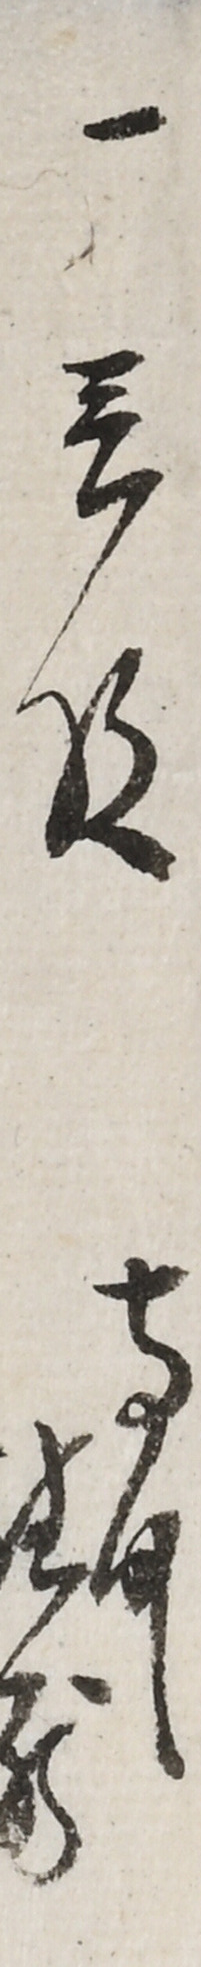一壱枚良吉
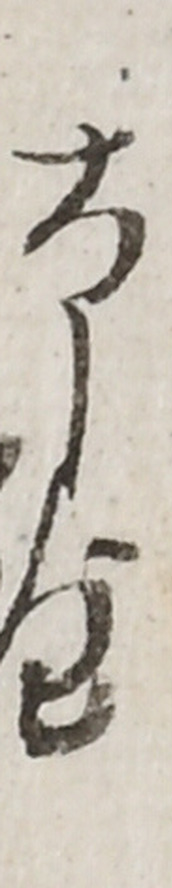大ノ屋
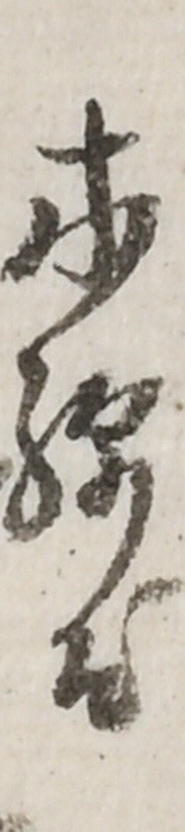木綿屋

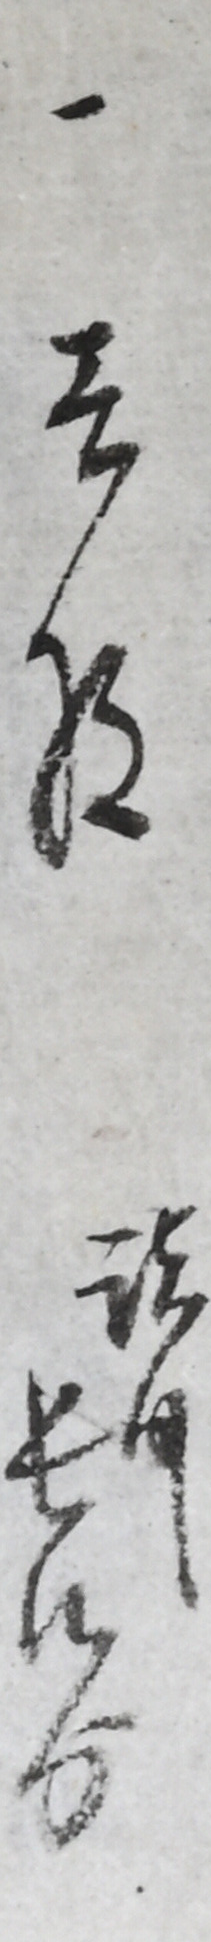一壱枚甚蔵
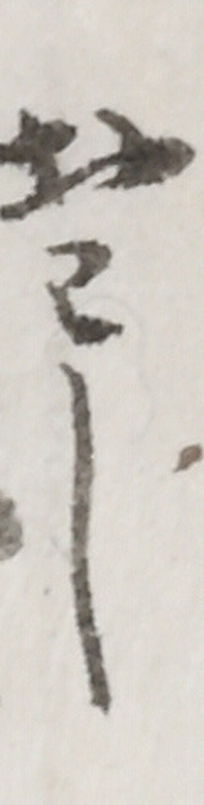おこし
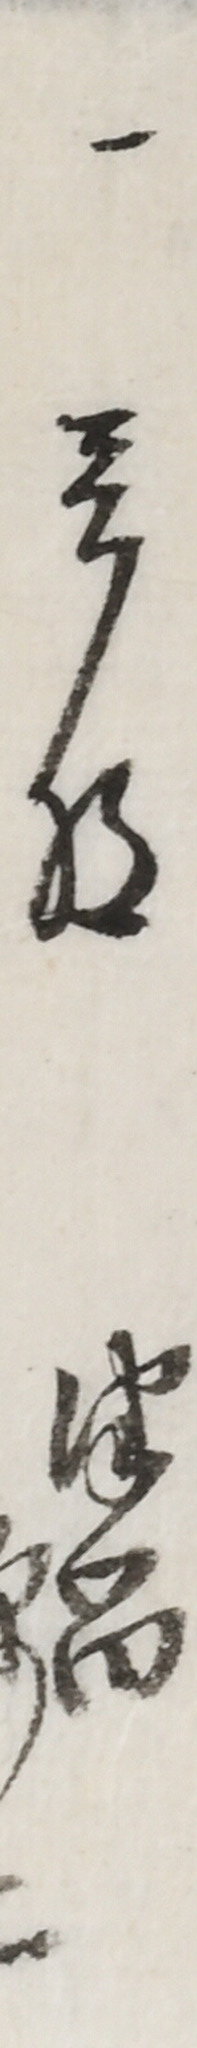一壱枚甚蔵
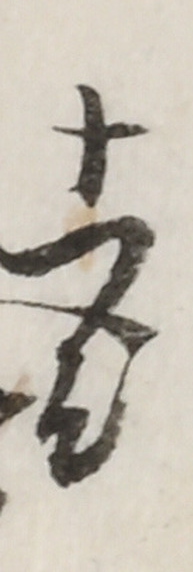十一屋
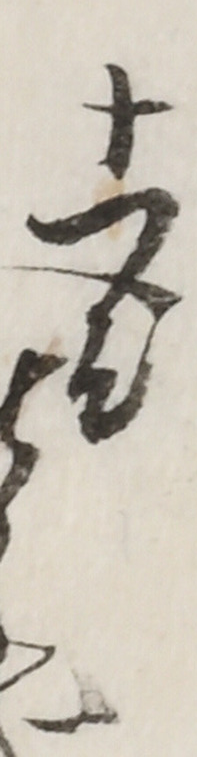十一屋
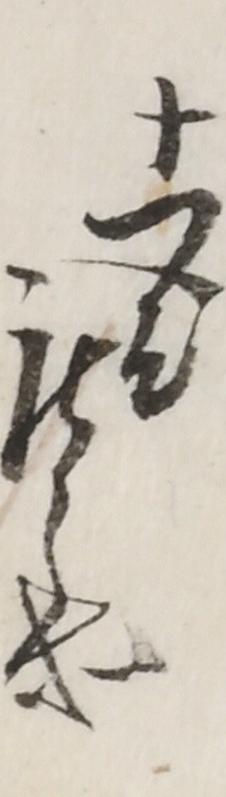十一屋
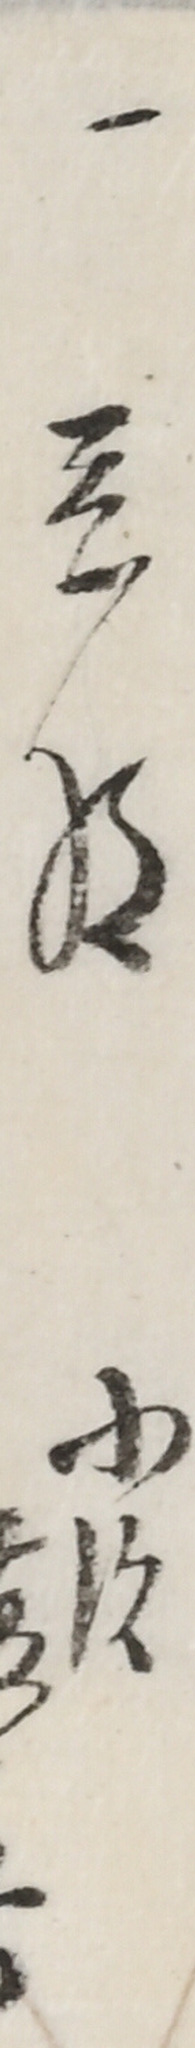一壱枚甚蔵
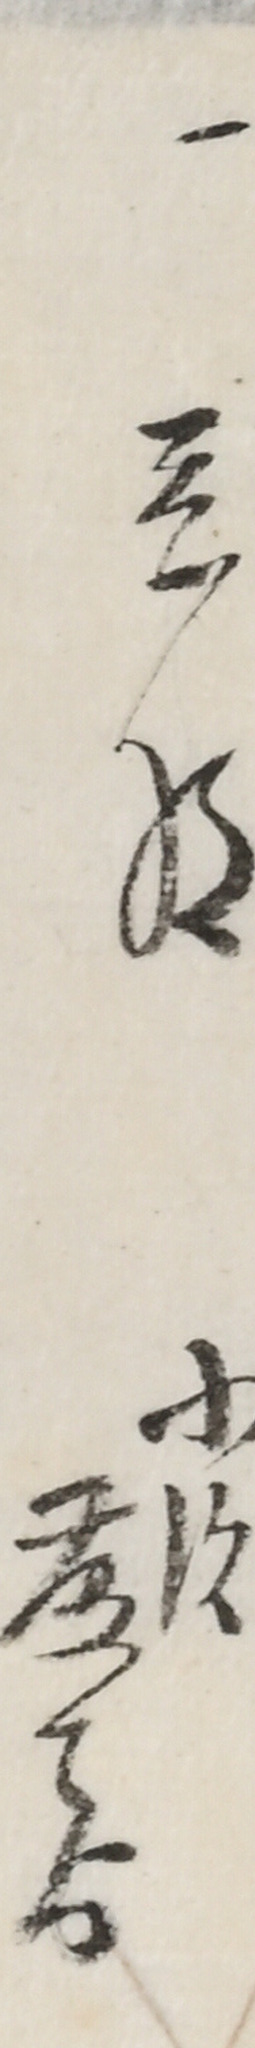一壱枚藤右衛門
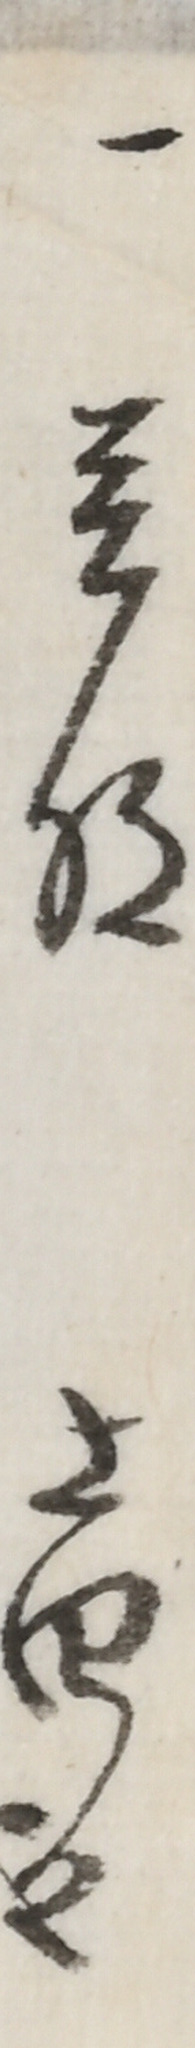一壱枚上田屋
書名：髙遠限楮幣引換覚帳
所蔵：伊那市立高遠町図書館・合同会社AMANE
